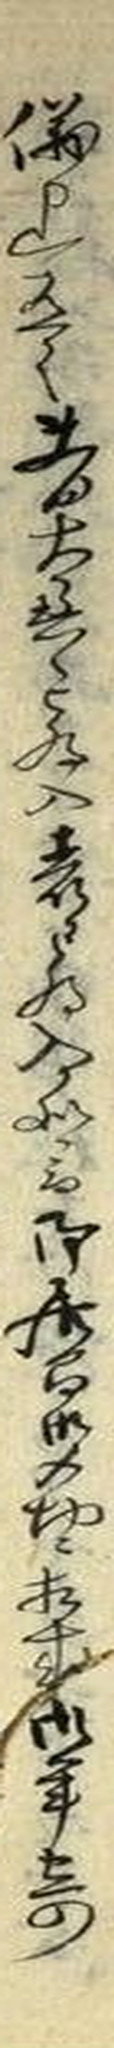儀申上有之夫ゟ大奥へ被為入表へ被為入候処ニ而御居間〆切ニ相成御年寄
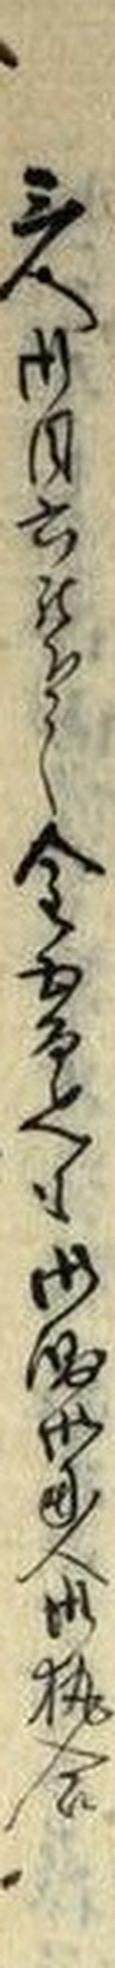三人御目六被下之金五百疋ツヽ御側御用人御執合
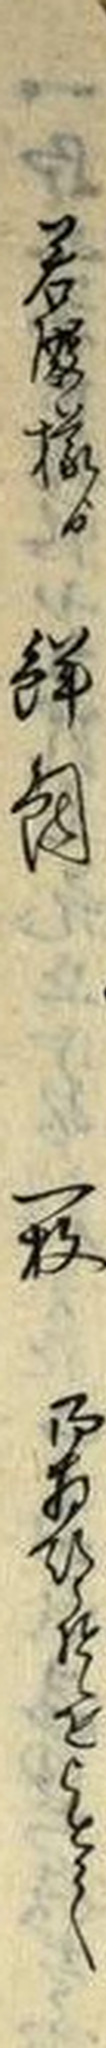若殿様ゟ鮮鯛一枚御拝領被遊候を被進之

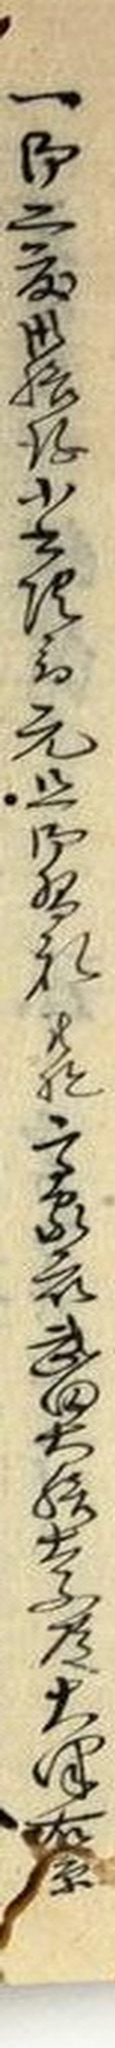一御二度御膳後小書院ニ而元旦御習礼被遊高家衆武田大膳太夫殿大澤右京
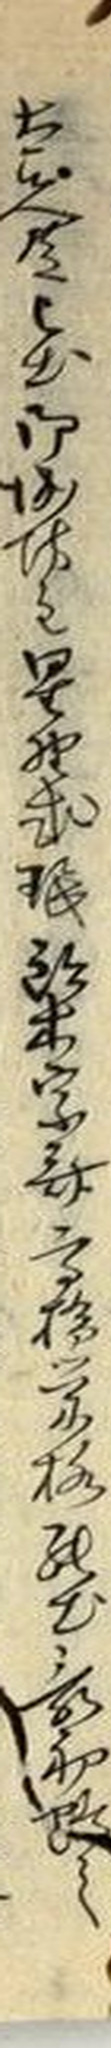太夫殿被出御城坊主星野求珉鈴木宗斎高橋栄格罷出最初鶴之
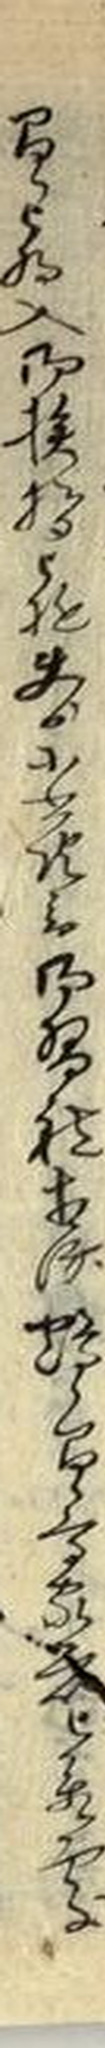間へ被為入御挨拶被遊夫ゟ小書院ニ而御習礼相済鶴之間へ高家衆被参候処
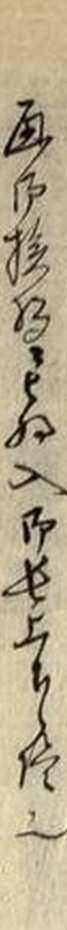再御挨拶被為入御長上下之儘也
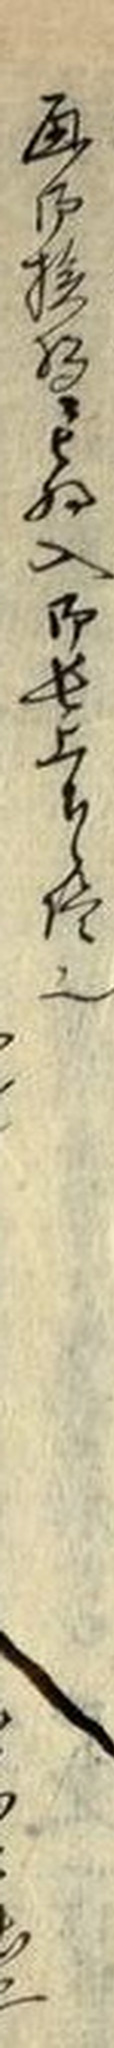再御挨拶被為入御長上下之儘也
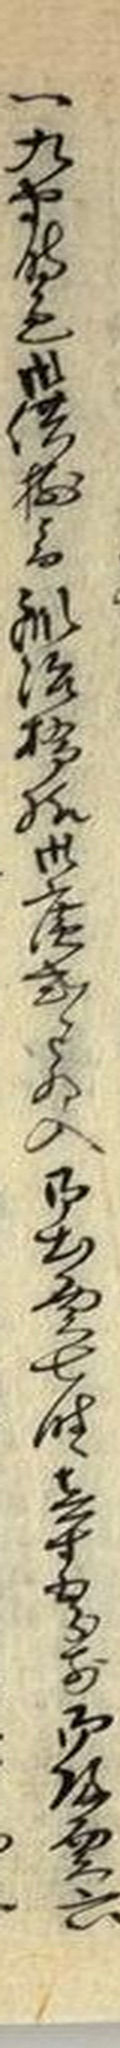一九半時過御供揃ニ而鍛冶橋様御広式へ被為入御出殿七時へ壱寸五分前御帰殿六
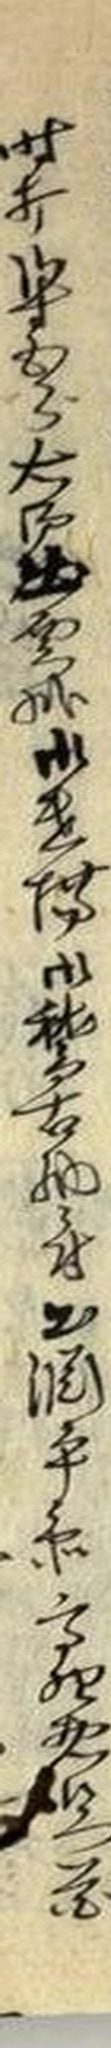時打弐寸五分右御出殿掛御遣場御稽古納ニ付出渕平兵衛高野宗惣左衛門花
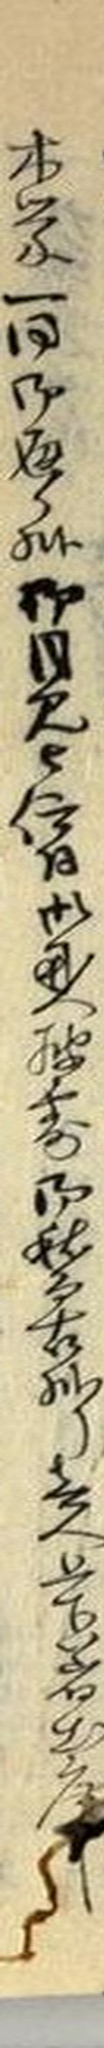木栄一同御通り掛御目見被仰付御用人披露御稽古掛り壱人上下着出座
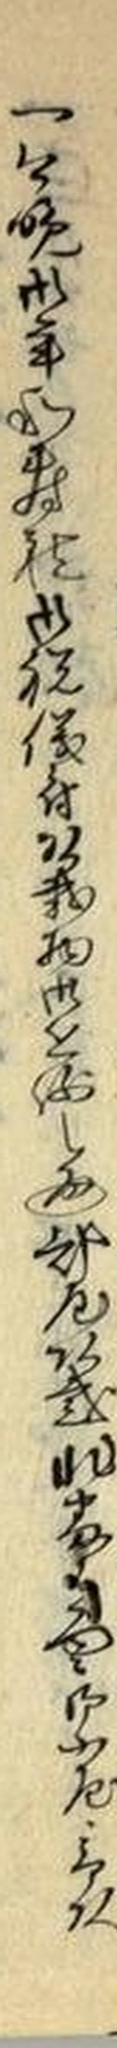一今晩御年和寿礼御祝儀ニ付頂戴物御近例之通部屋頂戴非番之面々御小屋ニ而頂
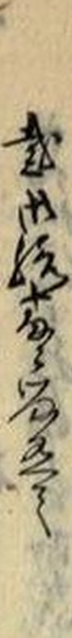戴御膳番ニ留有之
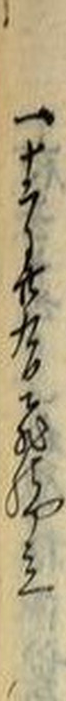一十二月廿九日飛脚立
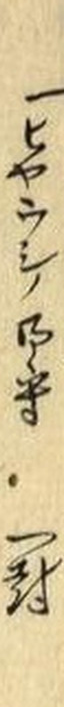ヒヤウシノ御守一封
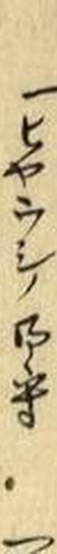ヒヤウシノ御守一封
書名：少傅日録抄（斉承付側向頭取日記、在府）
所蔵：福井県文書館 Fukui Prefectural Archives
